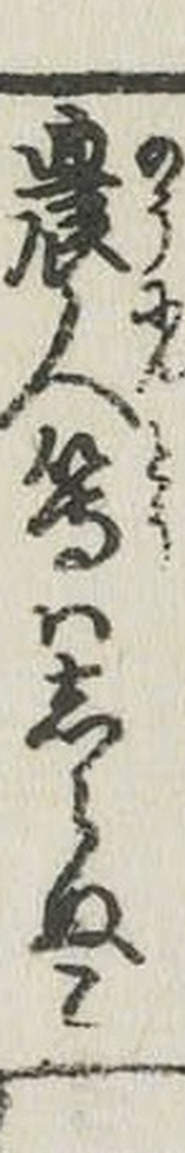農人等はしらぬこ
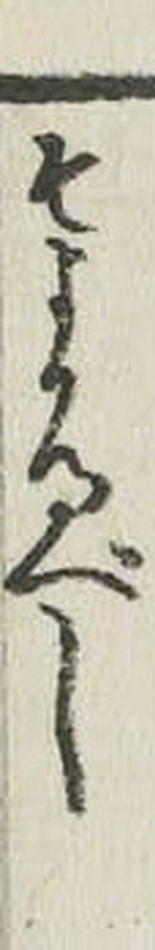そよかるべし
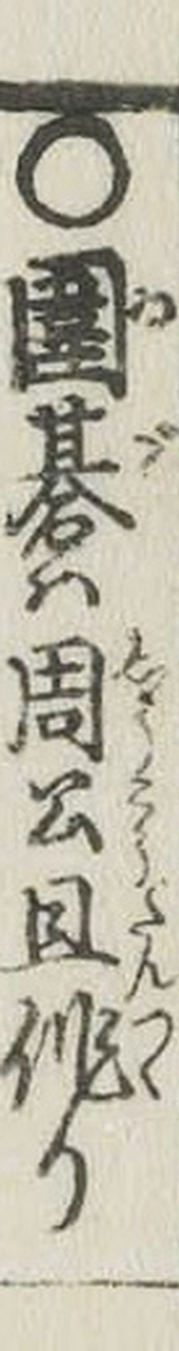○囲碁は周公旦作り
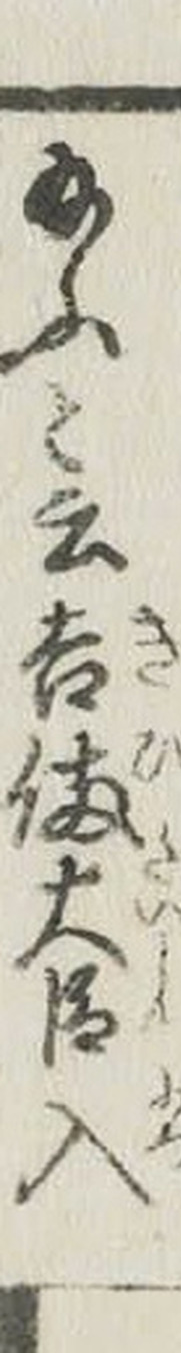給ふと云吉備大臣入
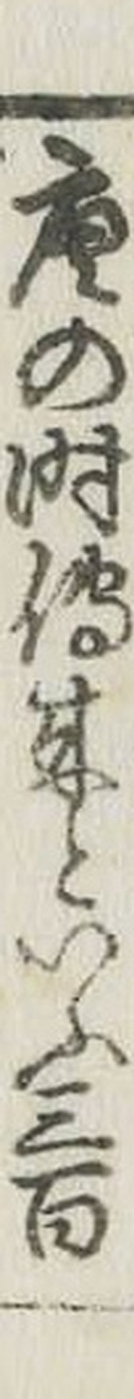唐の時伝来といふ三百
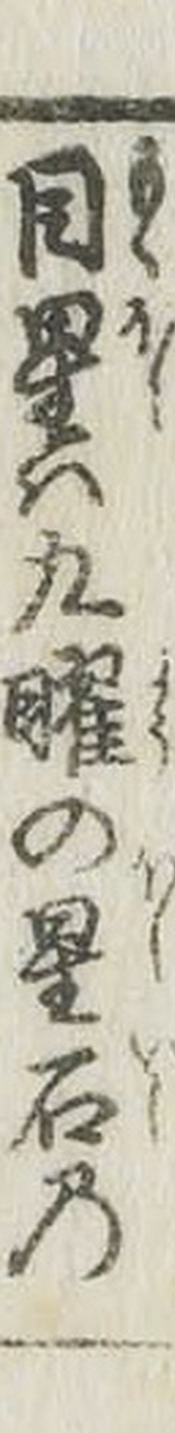目星は九曜の星石の
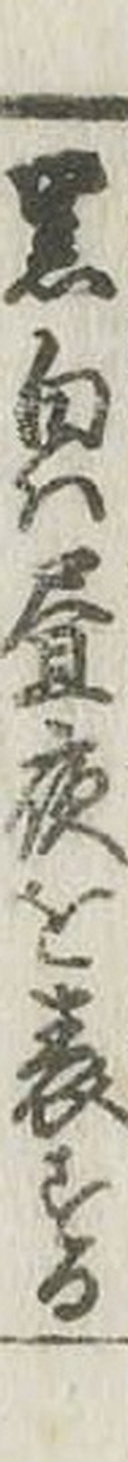黒白は昼夜を表する
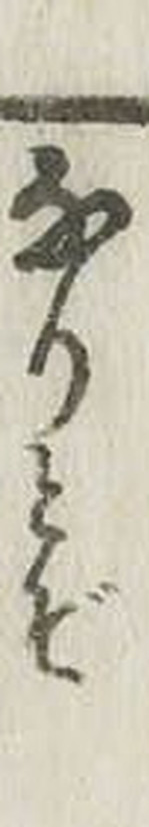なりとぞ
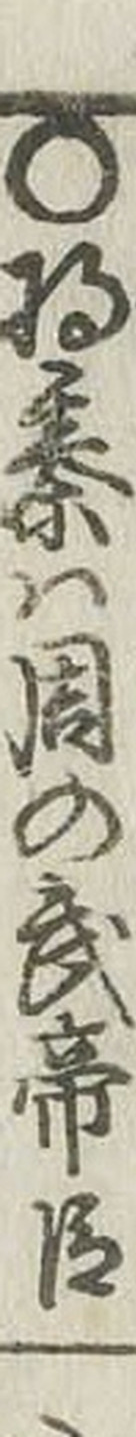○将棋は周の武帝臣
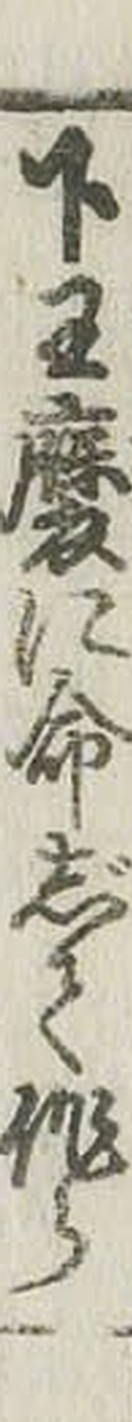下王褒に命じて作ら
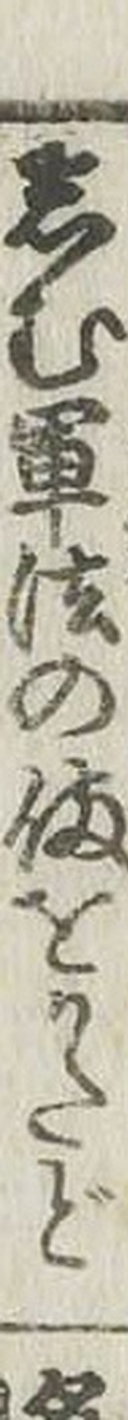しむ軍法の備をかたど
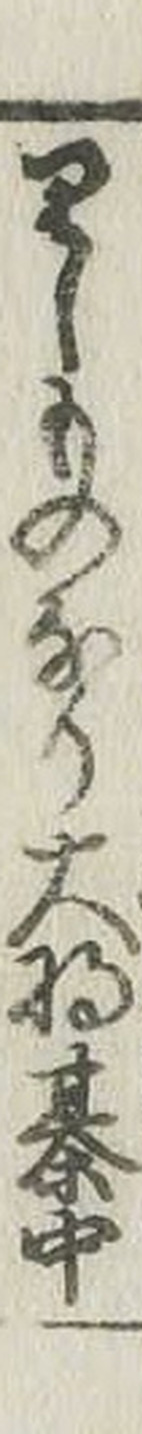りしものなり大将棋中
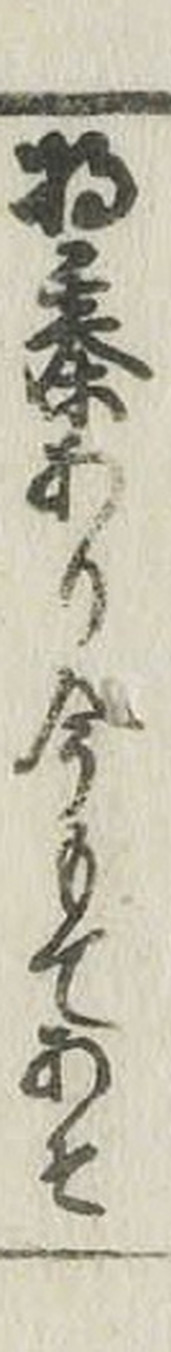将棋あり今もてあそ
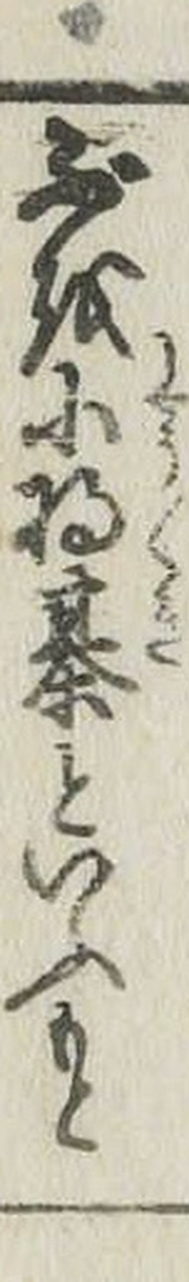ぶを小将棋といふもと
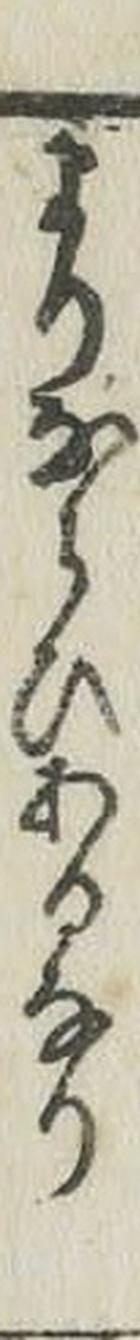よりならひあるなり

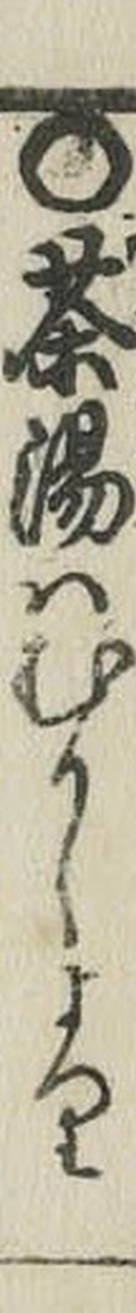○茶湯はむかしより
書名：増補頭書訓蒙図彙大成 10巻 10:巻之21
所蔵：東京学芸大学教育コンテンツアーカイブ
